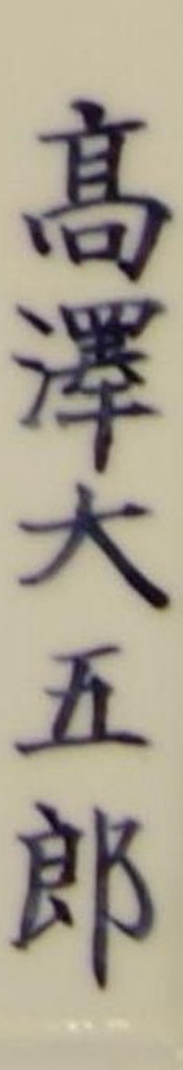高澤大五郎
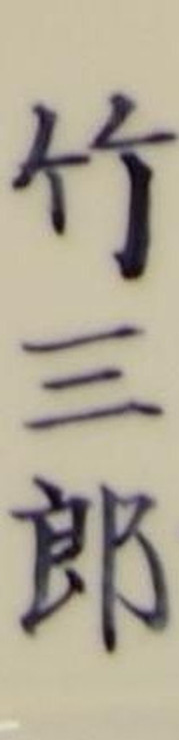竹三郎
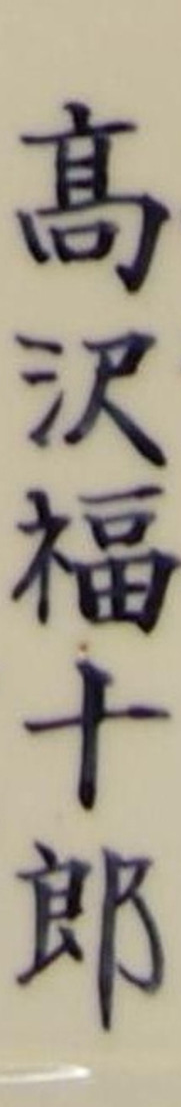高沢福十郎
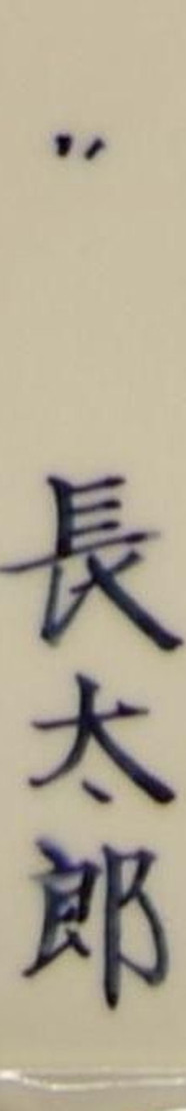長太郎
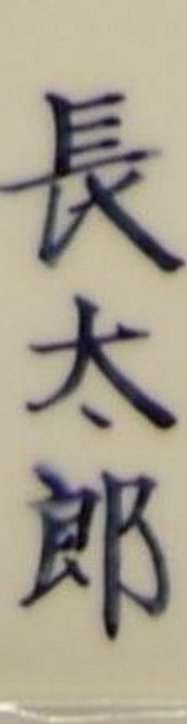長太郎
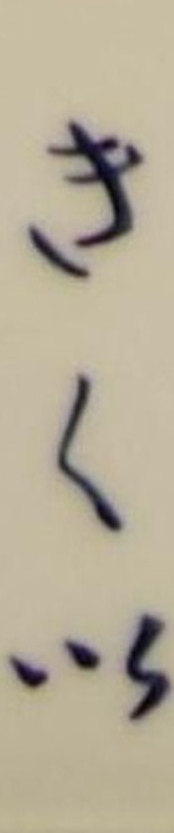きくい
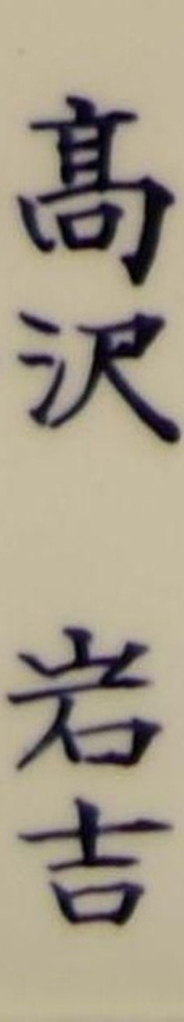高沢岩吉
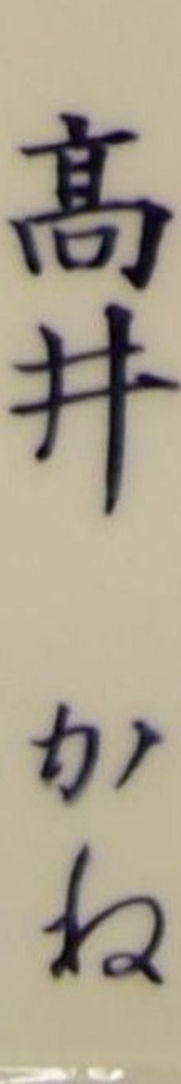高井かね
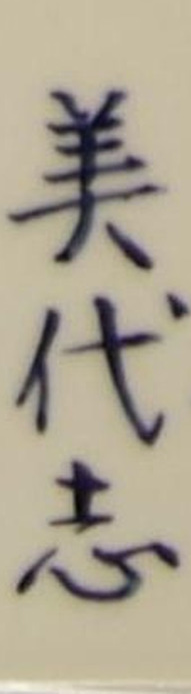美代志
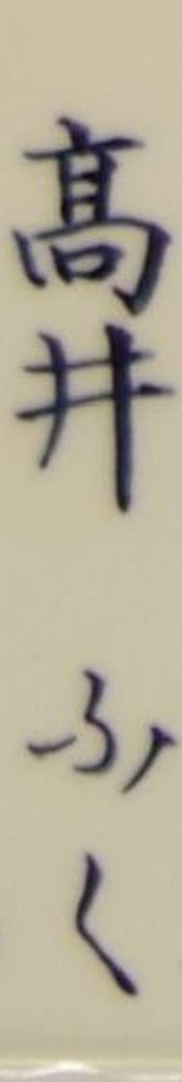高井ふく
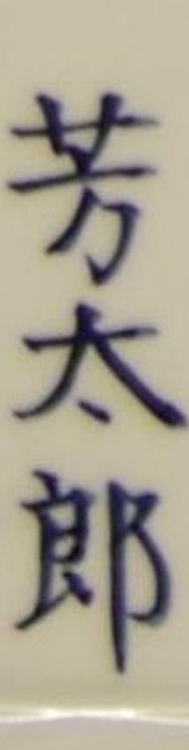芳太郎
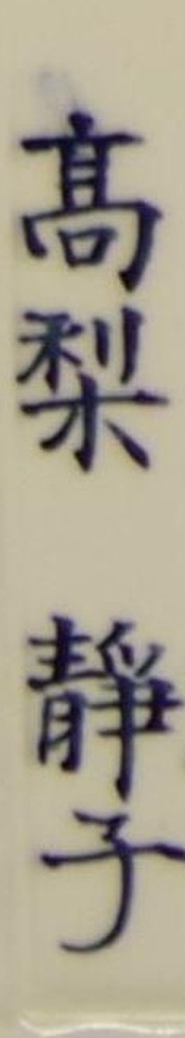高梨静子

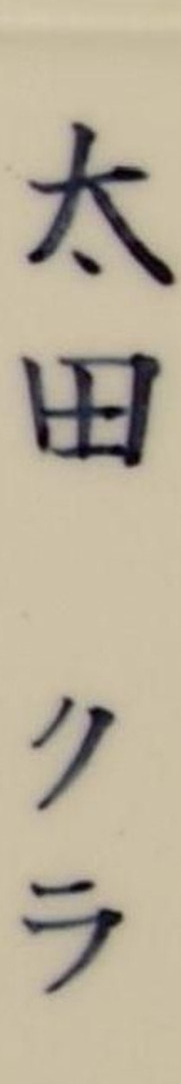太田クラ
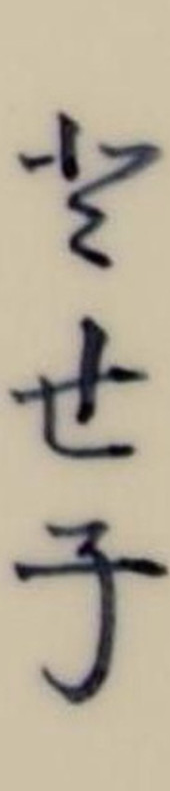とせ子
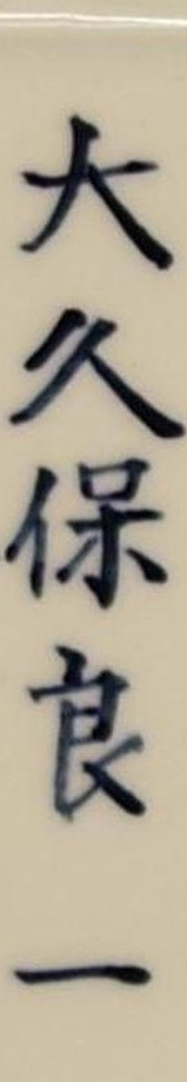大久保良一
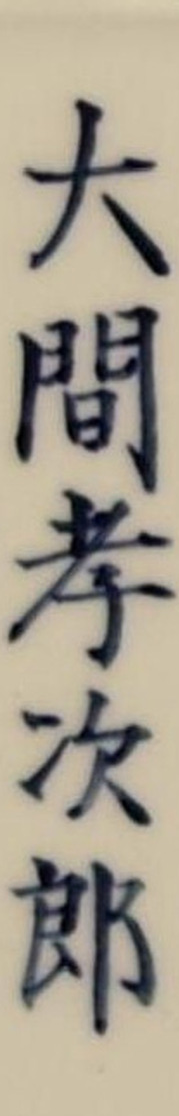大間孝次郎
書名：A~D
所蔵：koyasan kongobuji
